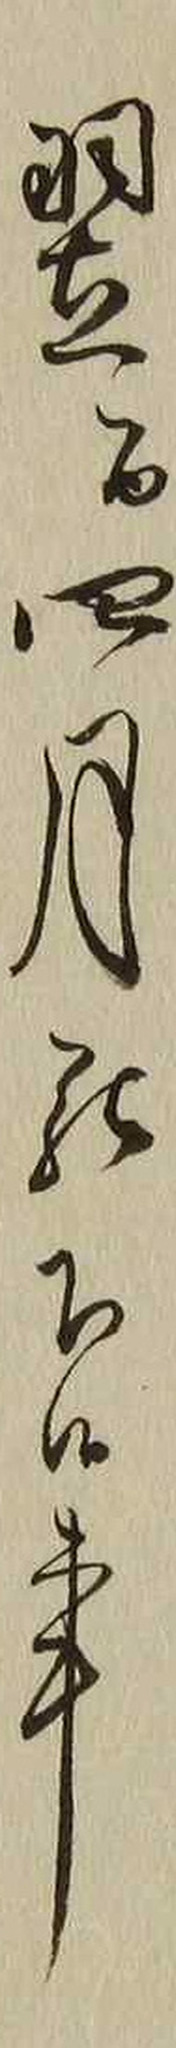翌酉四月罷下候事
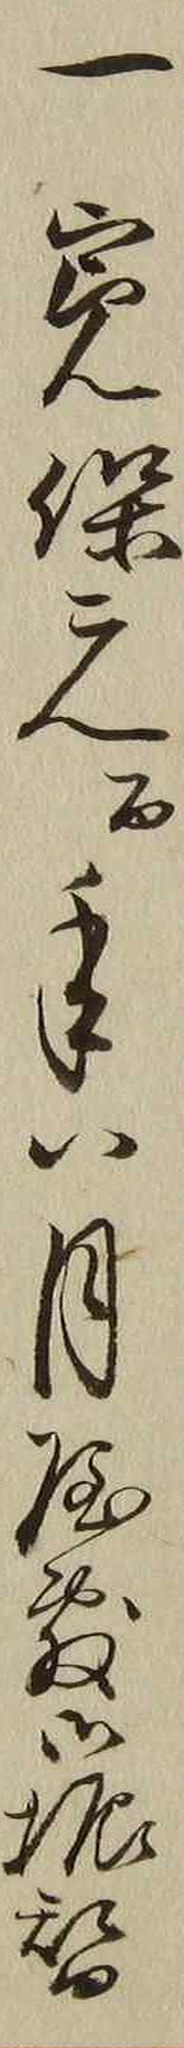一寛保元酉年八月屋敷御振替
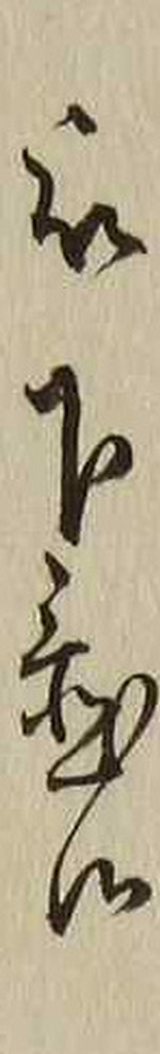被下置候
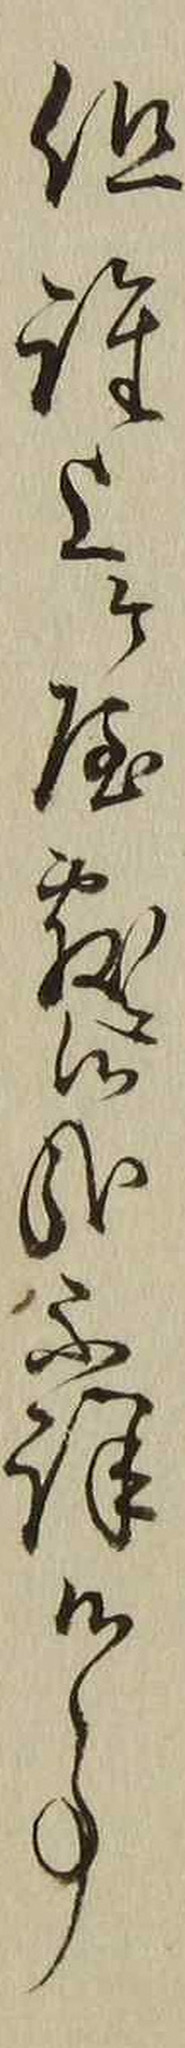但誰上ヶ屋敷ニ候哉不詳候事
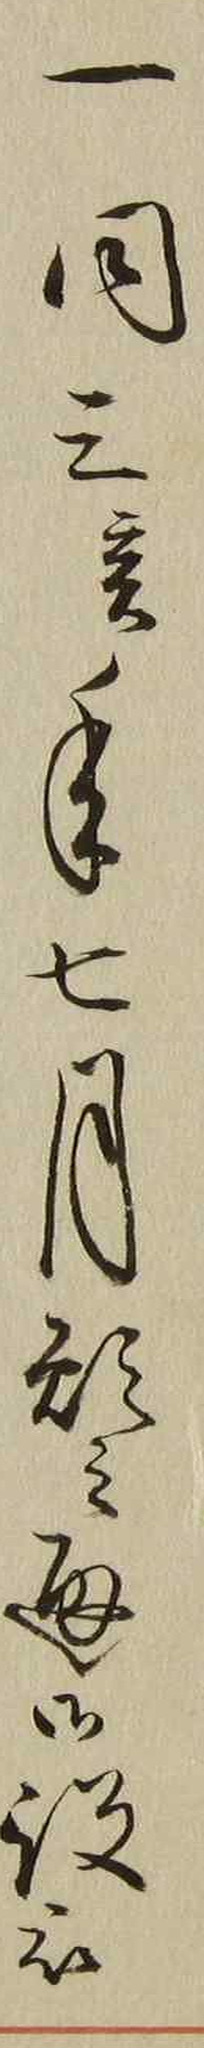一同三亥年七月願之通御役被
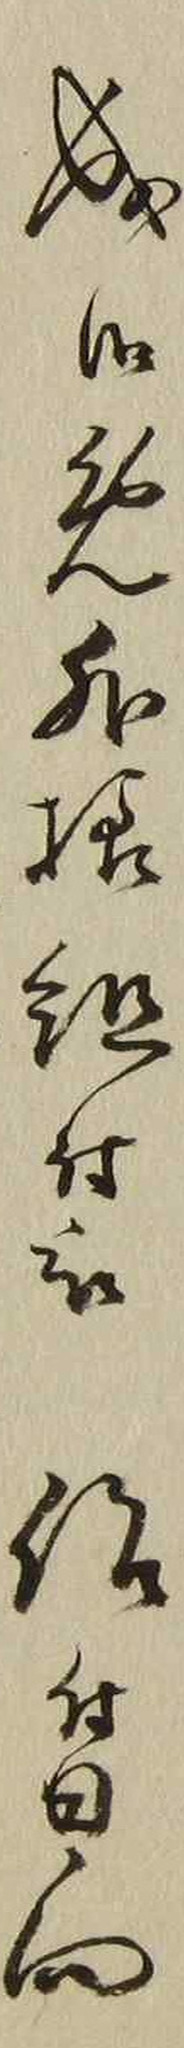成御免外様組付被仰付日向
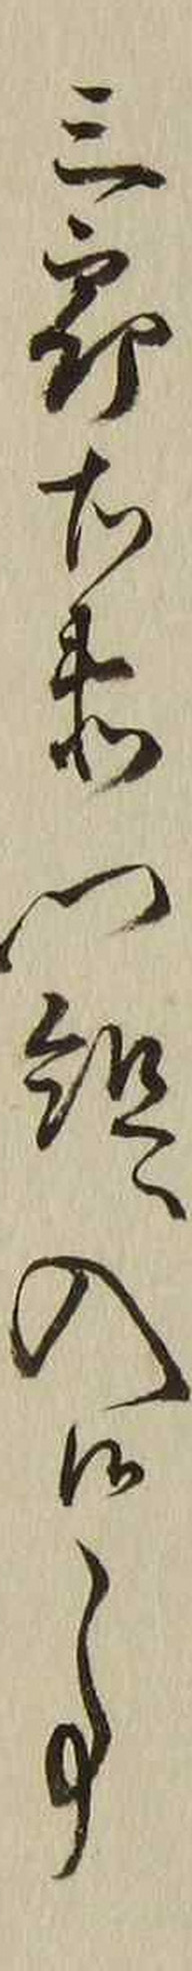三郎右衛門組へ入候事
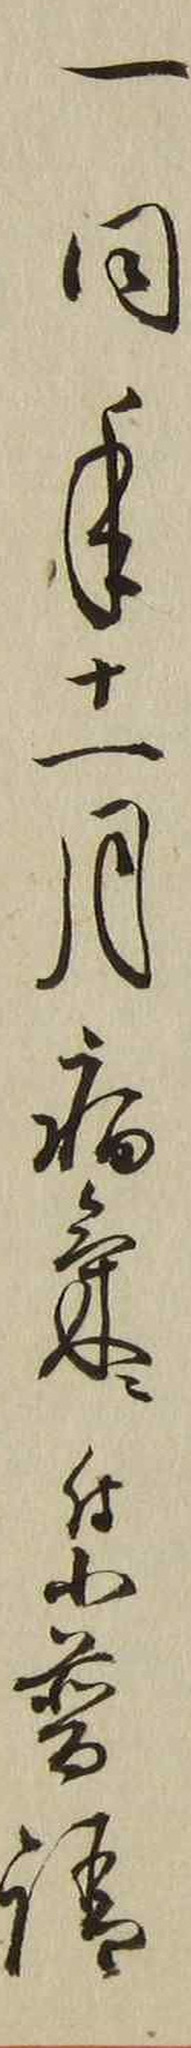一同年十一月病気ニ付小普請
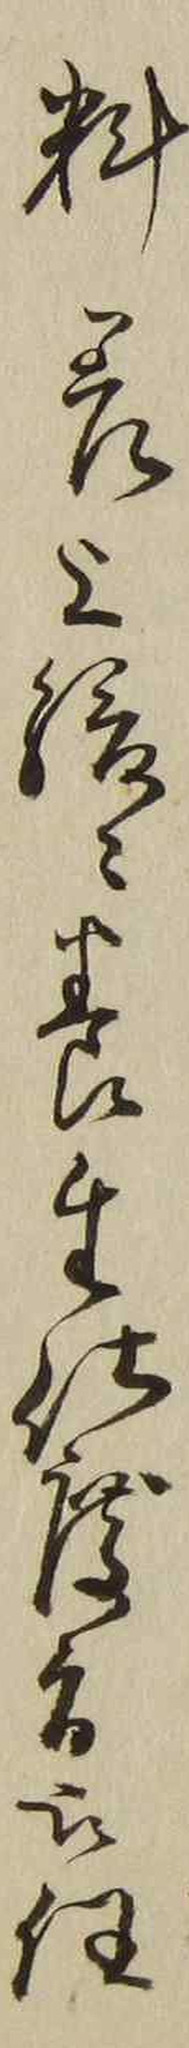料差上後ニ養生仕度旨被任

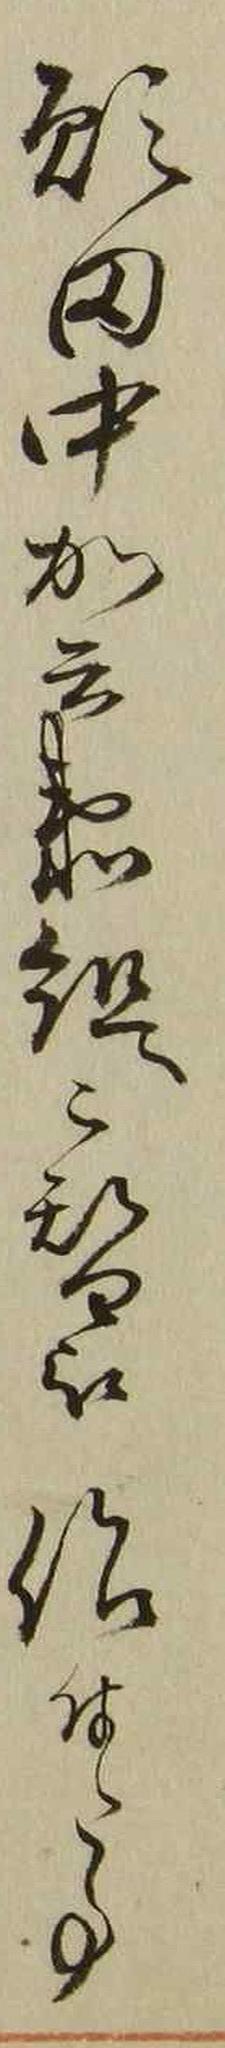願田中加兵衛組へ御替被仰付候事
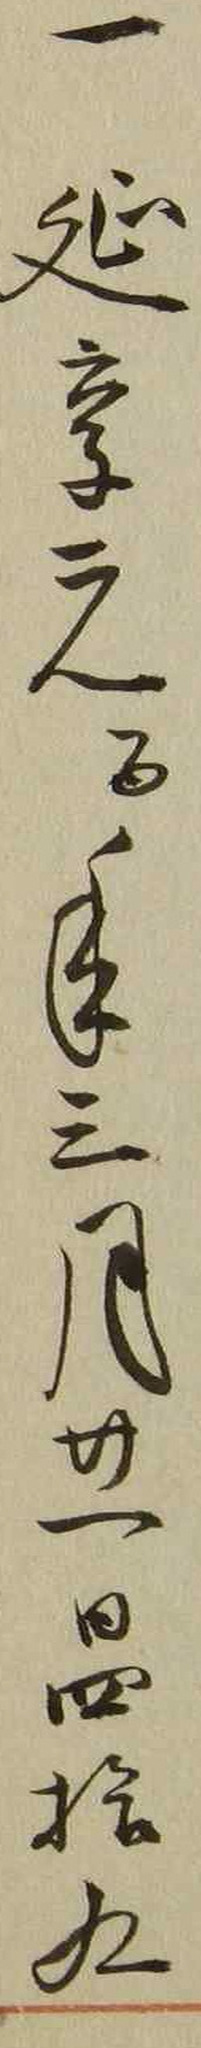一延享元子年三月廿一日四拾九
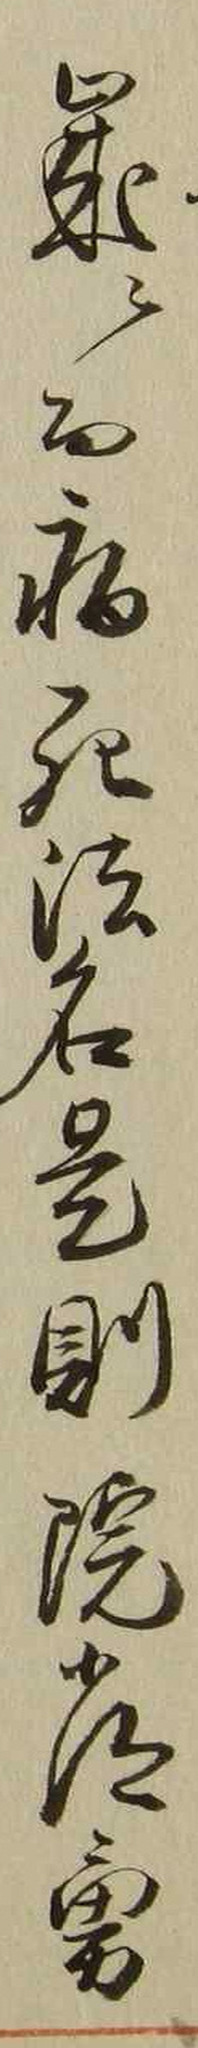歳ニ而病死法名是則院常勇
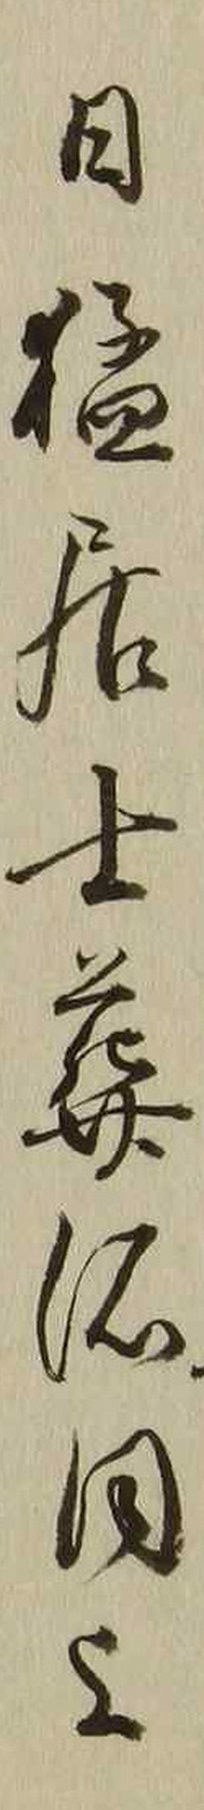日猛居士葬所同上
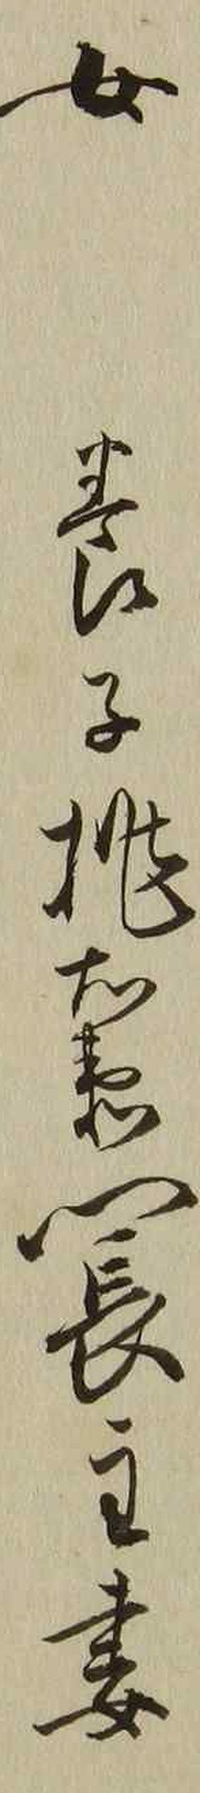女養子桃右衛門長主妻
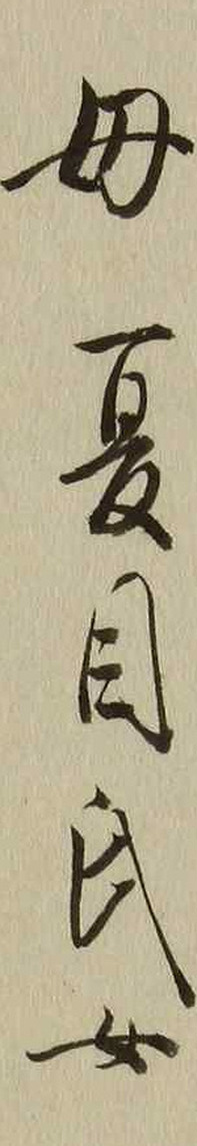母夏目氏女
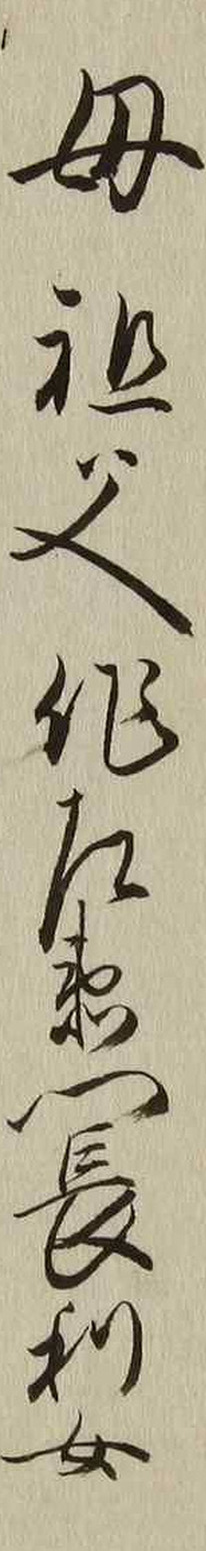母祖父作左衛門長利女
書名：諸士系譜　巻之57　ほ之部4
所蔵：会津若松市立会津図書館
